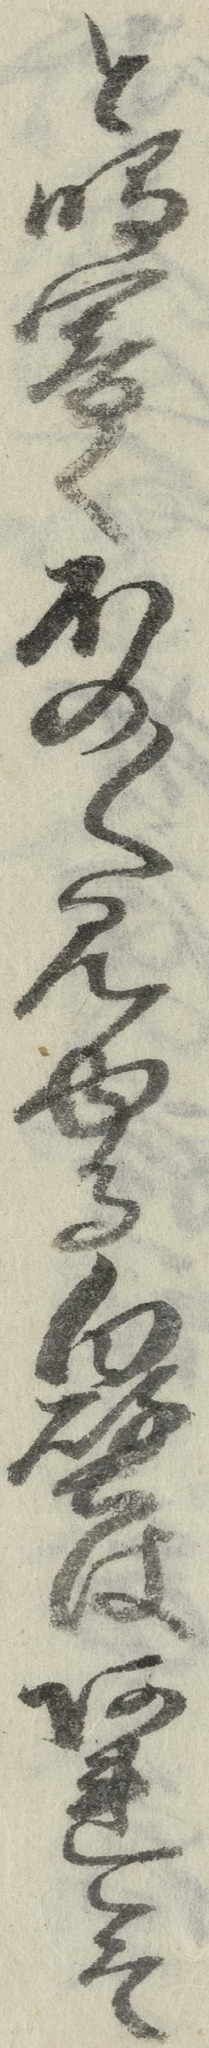と鳴響くほの〳〵見ゆる白壁はあれそ
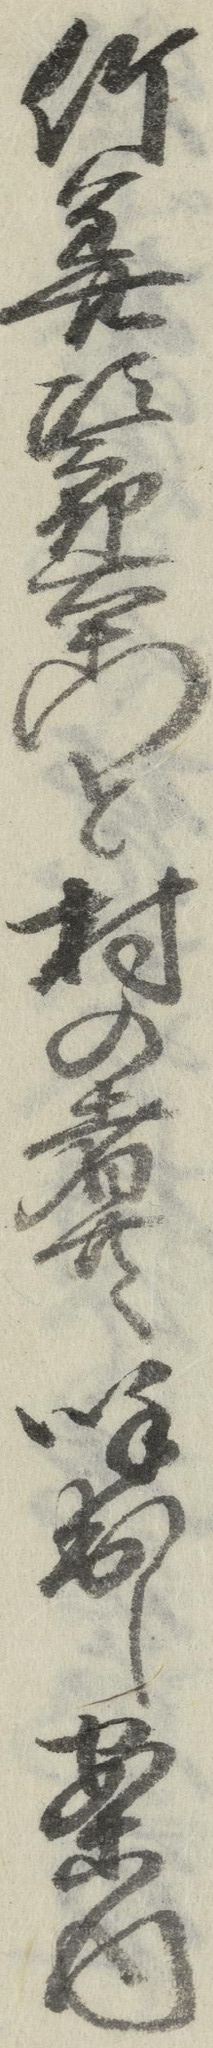竹善次郎右衛門と村の者共呼出し案内
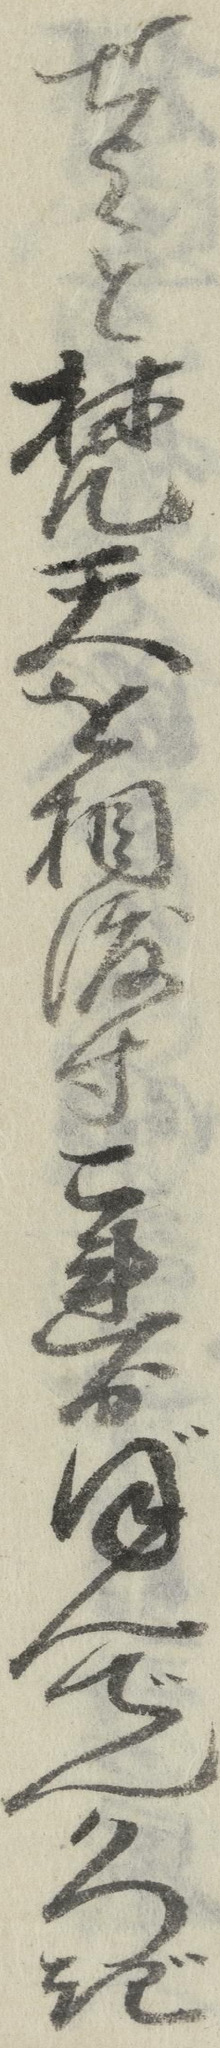せよと梵天を相渡すこれゟぼんでんかつぎ

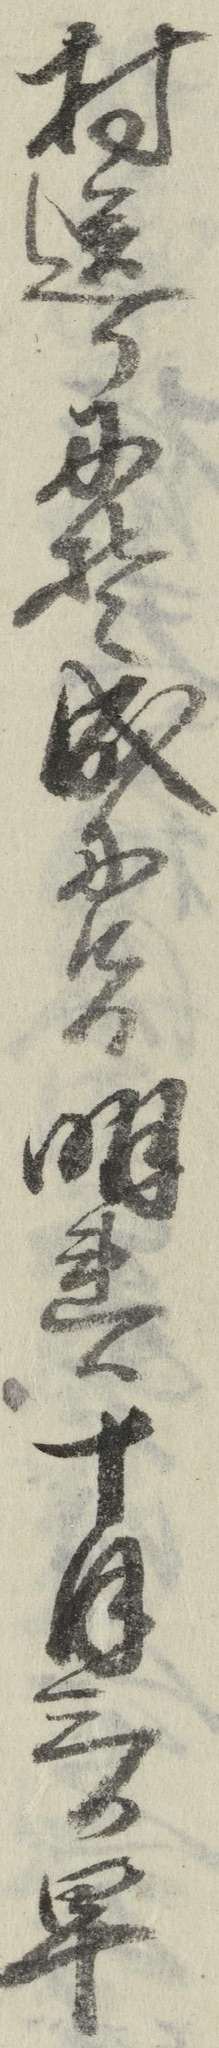村送りにそ成にける明れは十月三日早
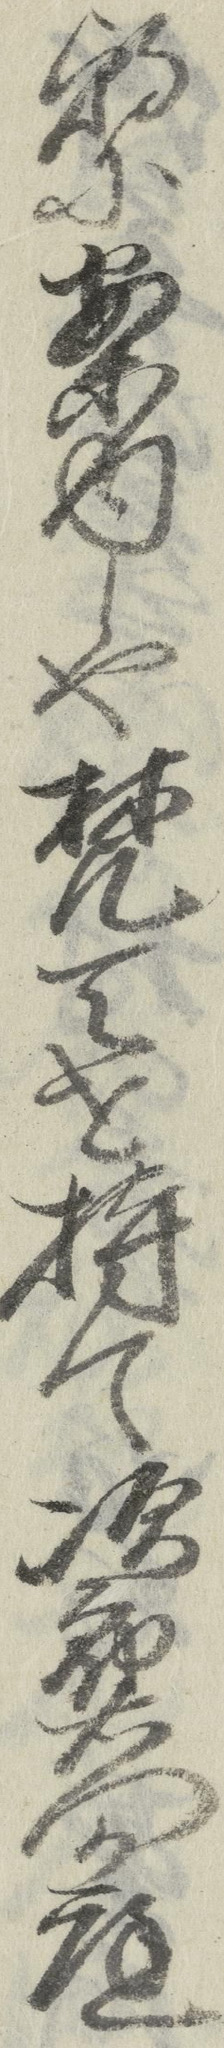朝に案内しや梵天を持て次郎右衛門か庭
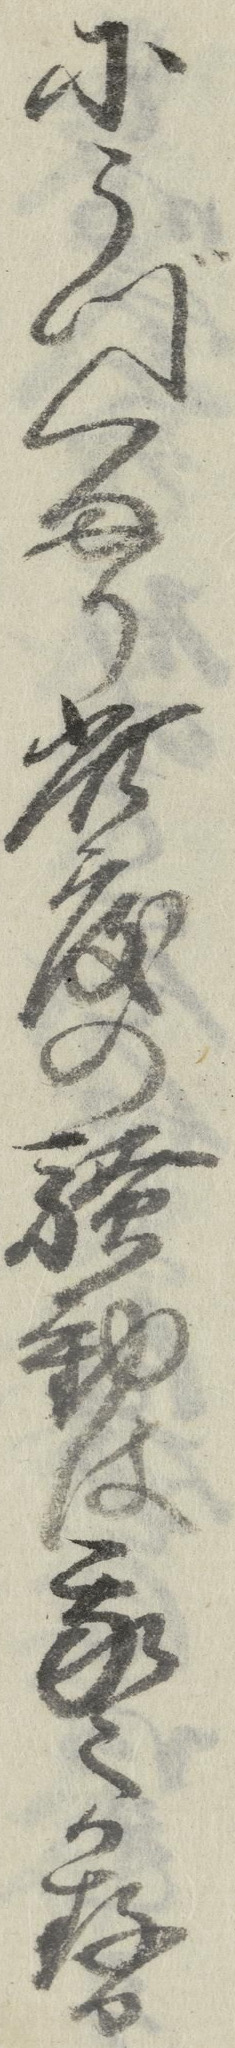にうづくまり此度の騒動は我々か存る
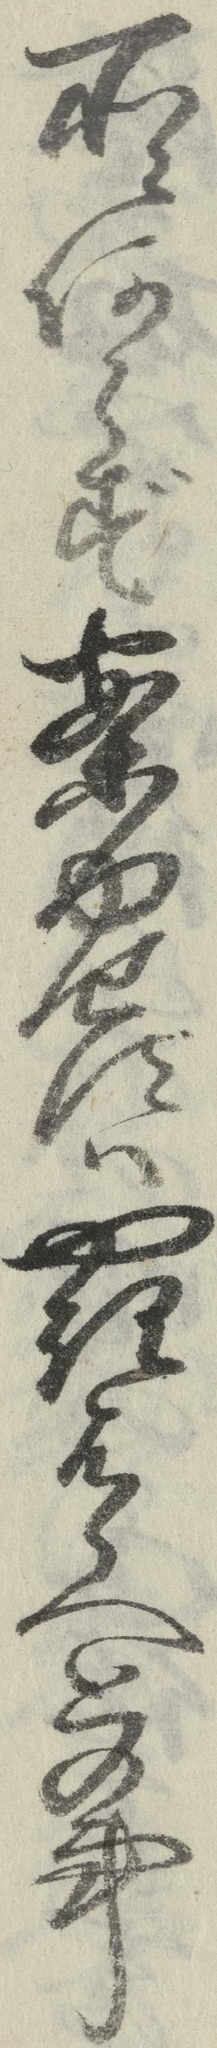所々あらず案内せずはやきはらへとの事
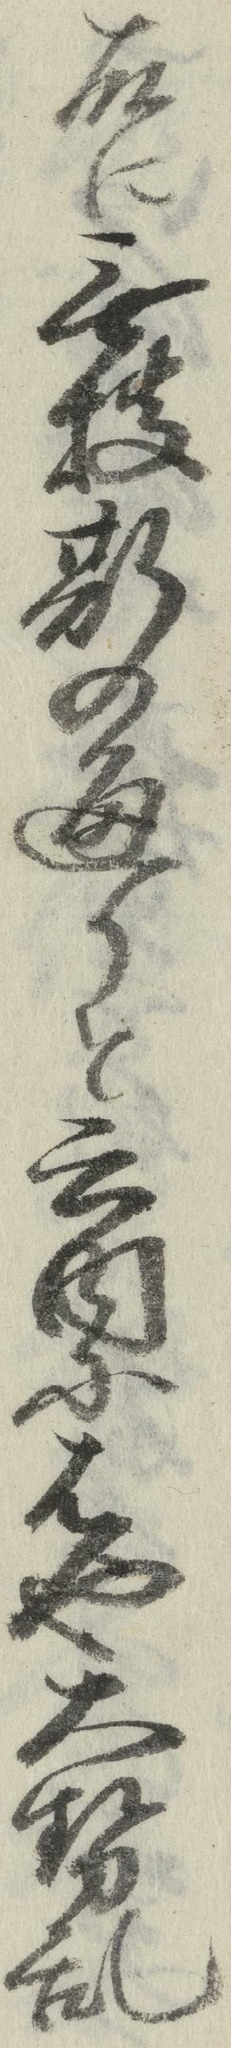故に無據斯の通りと云内にはや大勢乱
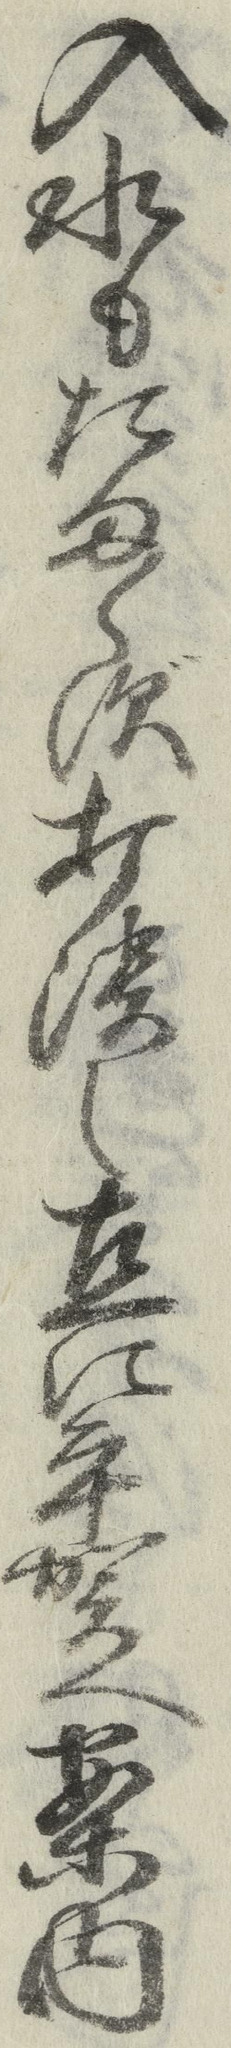入水もたまらず打潰し直に平賀へ案内
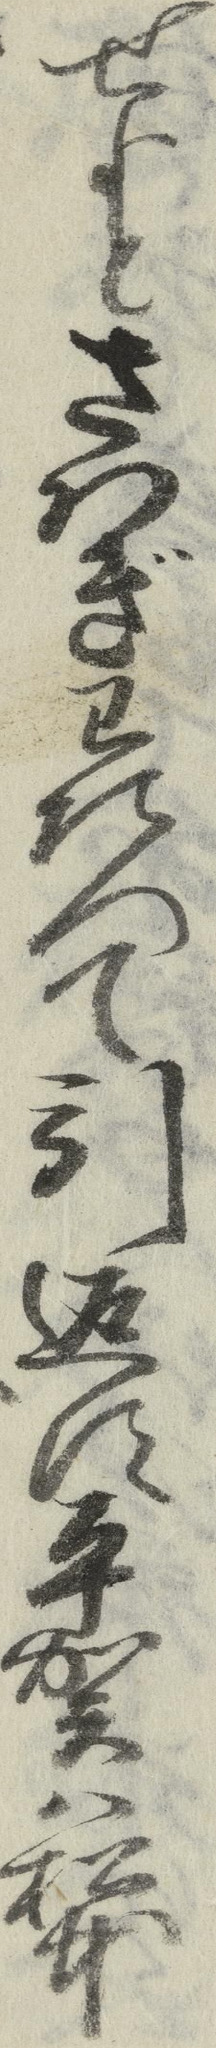せよとさわぎわたつて引返す平賀は松本
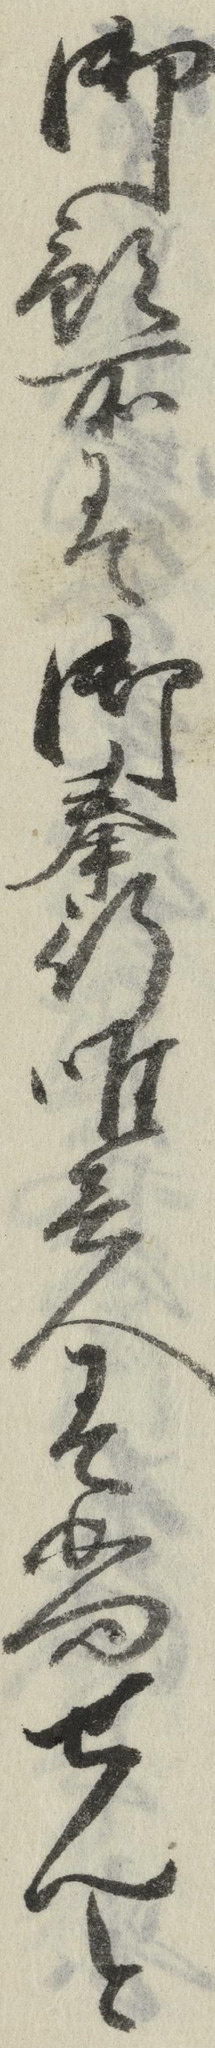御領所にて御奉行唯壱人にて如何せんと
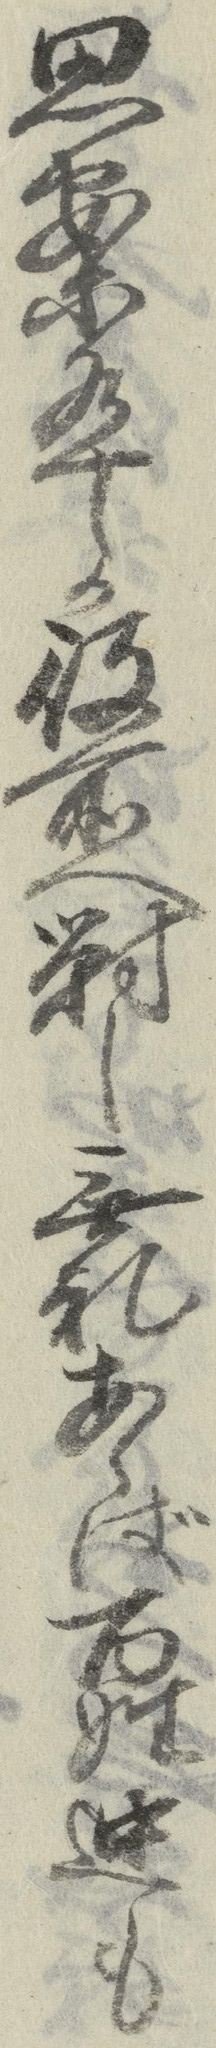思案有しか役所へ対し無礼あらば百姓迚も
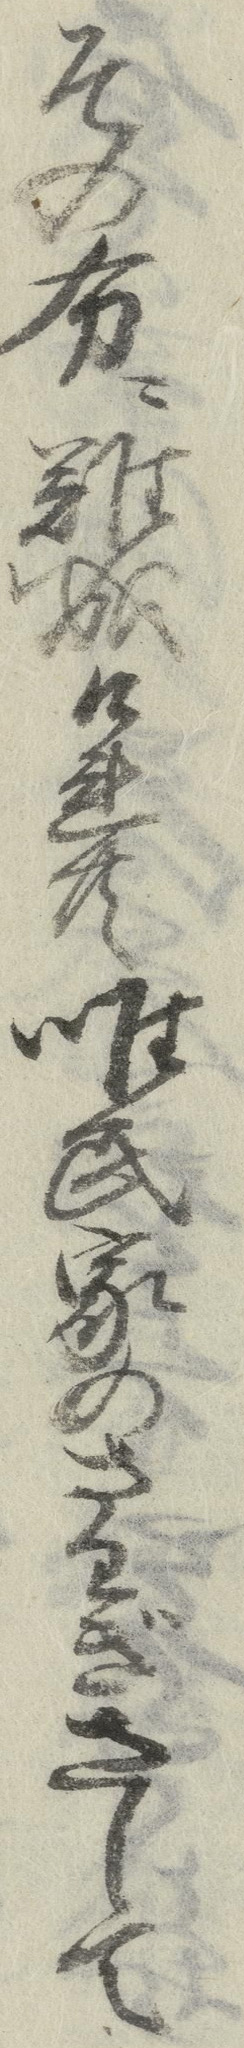その分に難成けれ共唯民家のさわぎさして
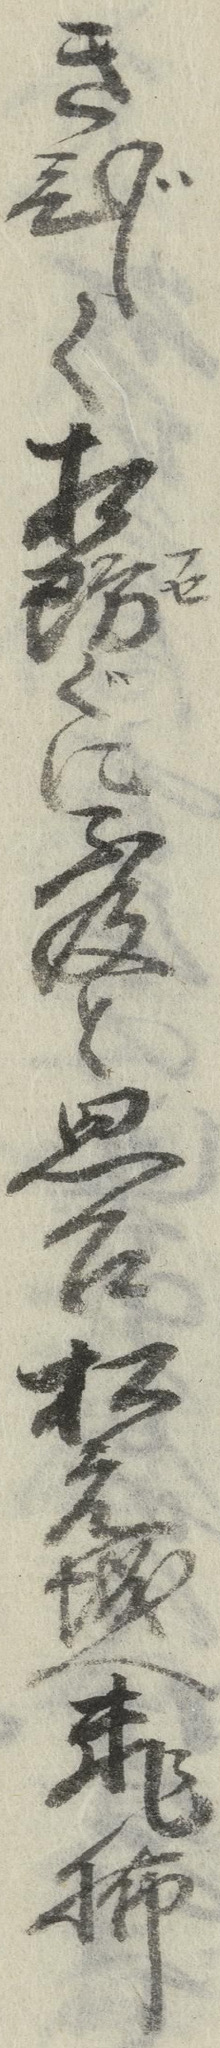きびしく相防ぐに不及と思召松え城へ飛脚
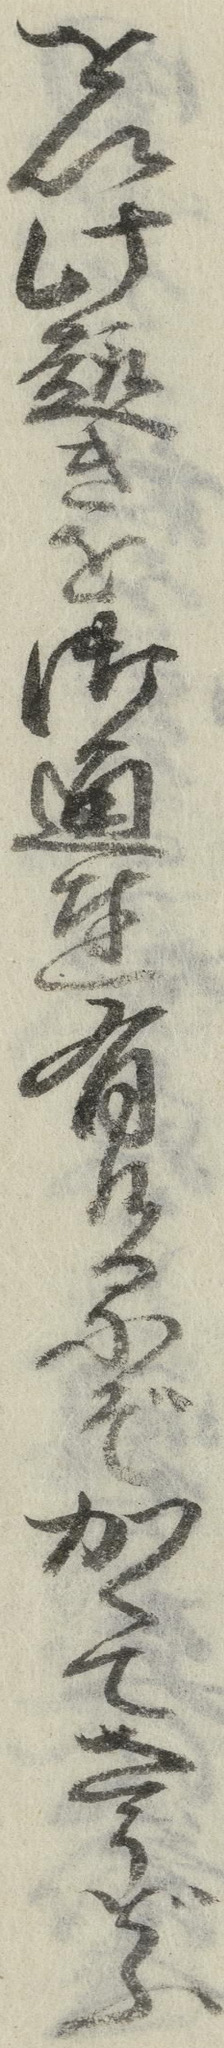を以て此趣きを御通達有けるにぞかくてさうどふ
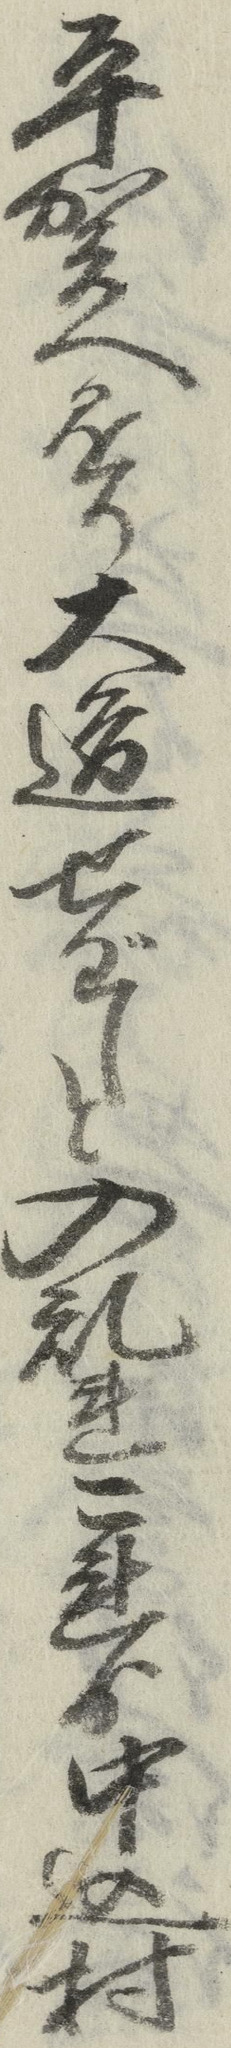平賀へ懸り大道せばしと入乱れこれゟ中込村
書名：浅間大焼騒動記　中
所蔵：東京大学地震研究所図書室 Earthquake Research Institute Library, The University of Tokyo, JAPAN
